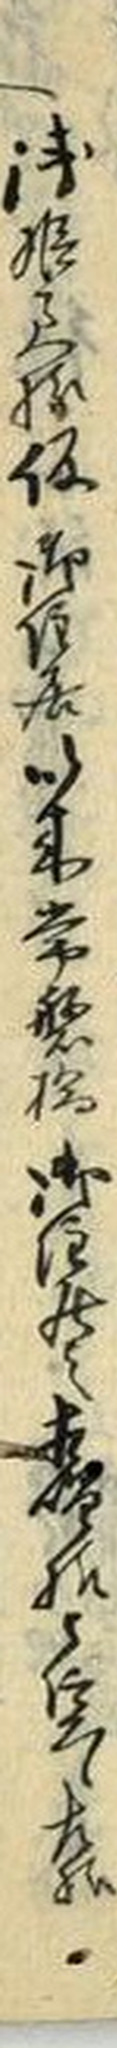浅姫君様仮御住居以来常盤橋御住居へ相移候様被仰出候左様
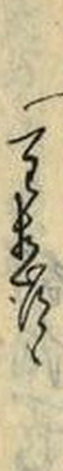可被相心得候

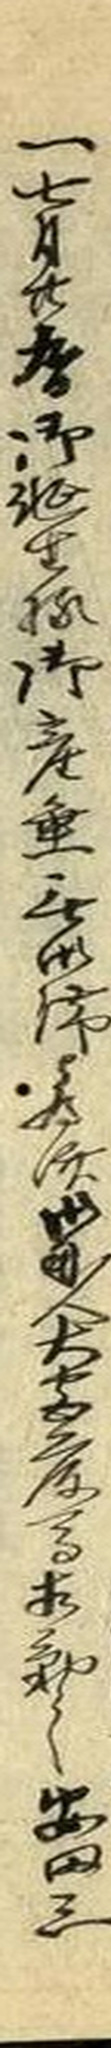一七月廿九日御誕生様御産垂無滞被為済御用人大宮藤馬相勤之安田三
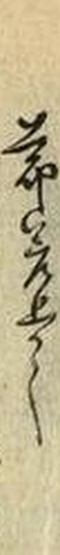節差上之
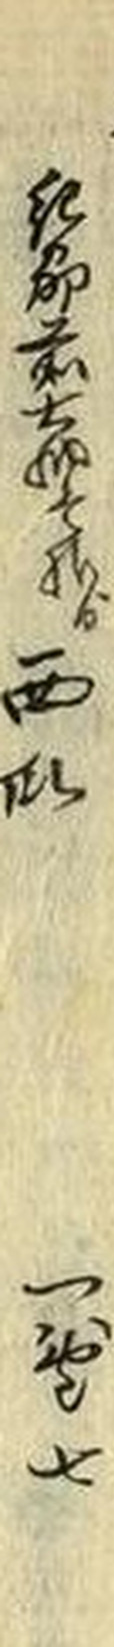紀州前大納言様ゟ西瓜一台七
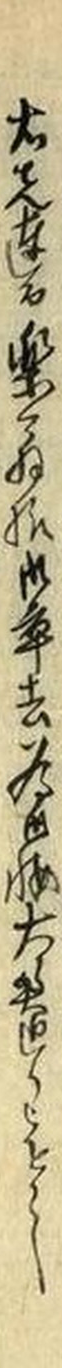右先達而楽翁様御卒去為御悔大奥廻り被進之
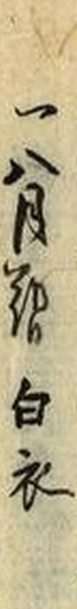一八月朔日白衣
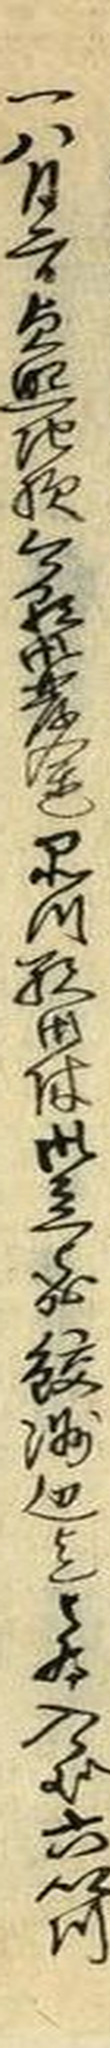一八月二日貞照院様今朝御発途品川駅御休御立被成鮫洲辺迄被為入候処六郷川
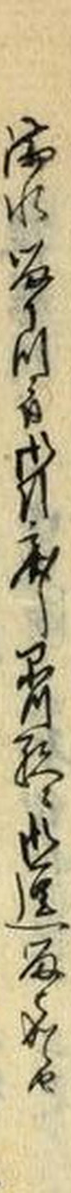満水留り川ニ付御引戻り品川駅ニ御逗留被成候由
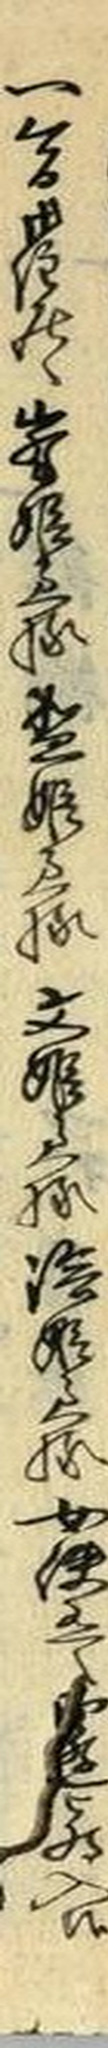一今日御住居へ峯姫君様盛姫君様文姫君様溶姫君様女使有之御逢被為入候
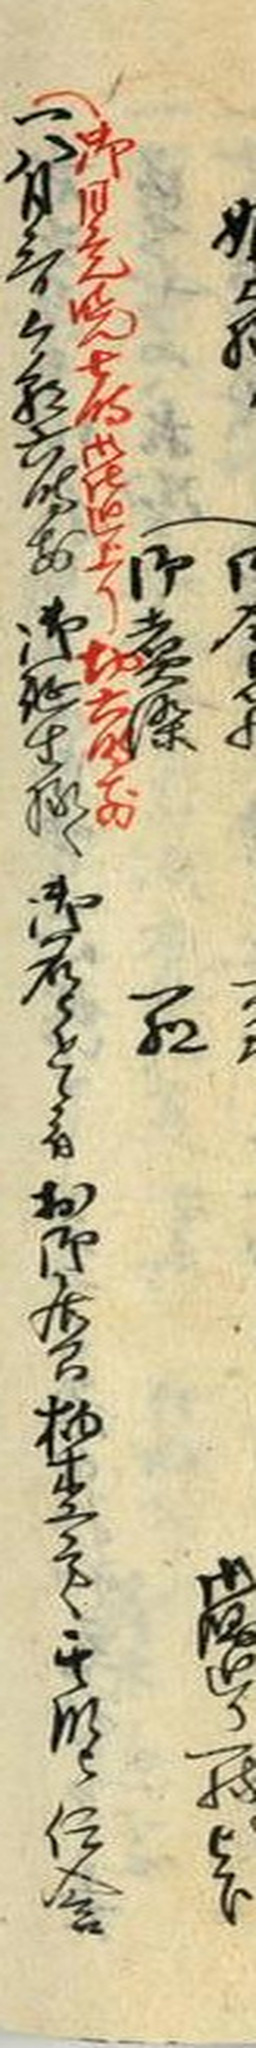一八月三日今朝六時前御誕生様へ御名被進候ニ付於御居間木工方へ其段被仰含
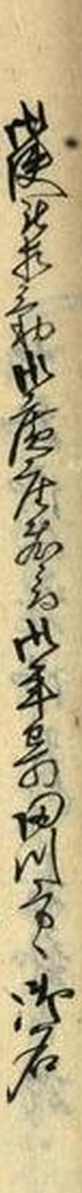御使被相勤御広座敷ニ而御年寄田川方へ御名
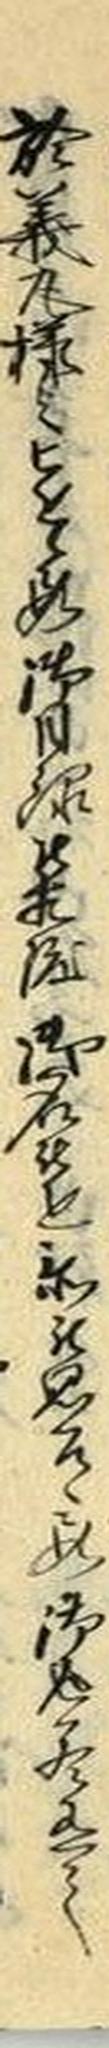於義丸様と被進候段御目録被相渡御名被進忝被思召候段御返答有之
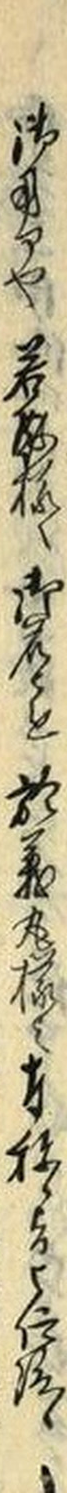御用部や若殿様へ御名被進於義丸様と奉称候旨被仰渡候
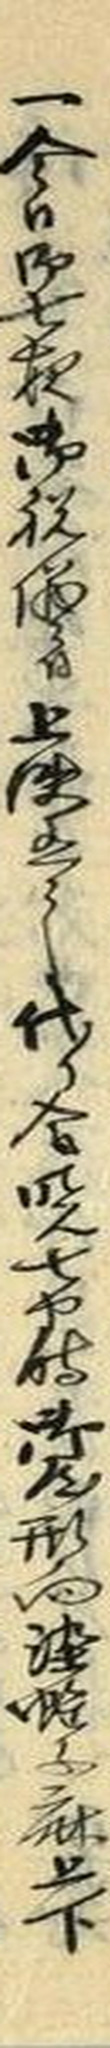一今日御七夜御祝儀ニ付上使有之代り合暁七半時御屋形向染帷子麻上下
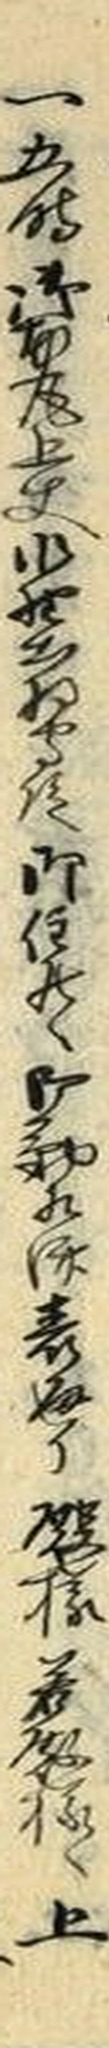一五時御本丸上使水野出羽守殿御住居へ御勤相済表通り殿様若殿様へ上
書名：少傅日録抄（斉承付側向頭取日記、在府）
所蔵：福井県文書館 Fukui Prefectural Archives
